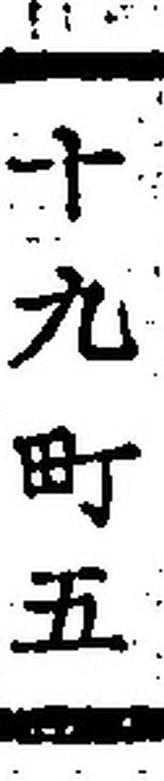十九町五
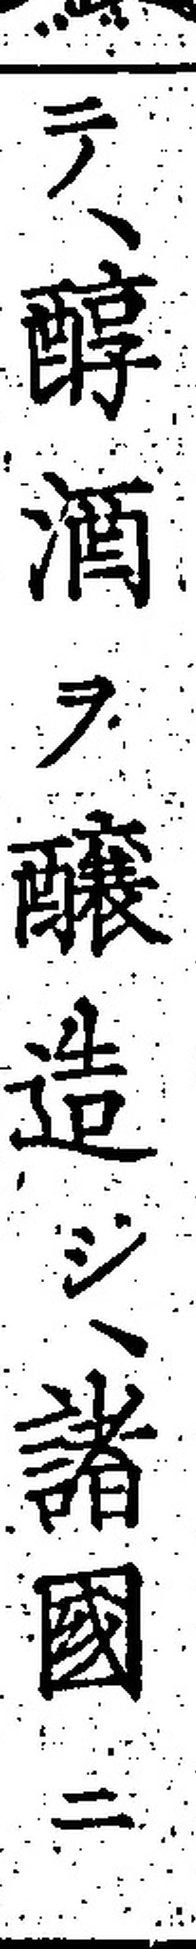テ、醇酒ヲ醸造シ、諸国ニ
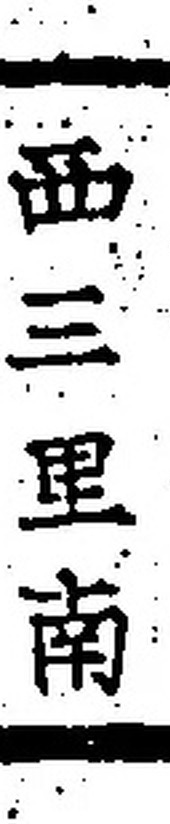西三里南
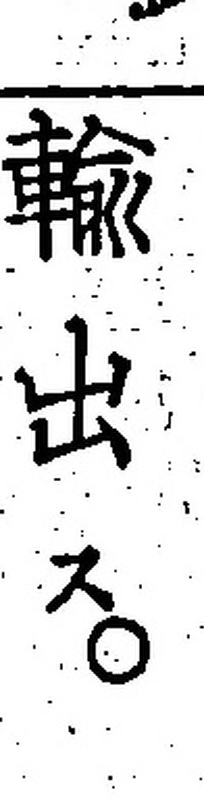輸出ス。
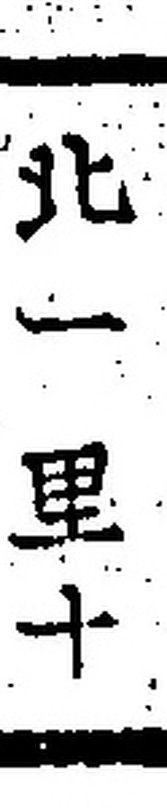北一里十
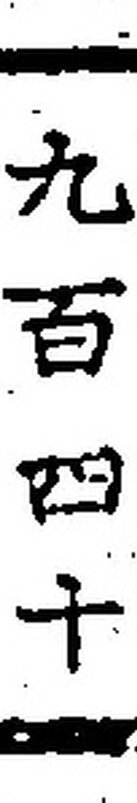九百四十
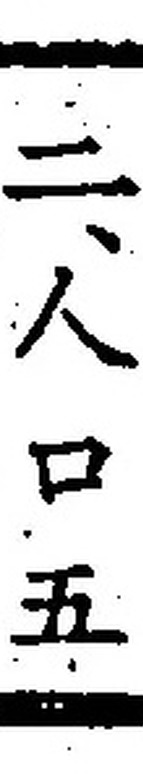二、人口五
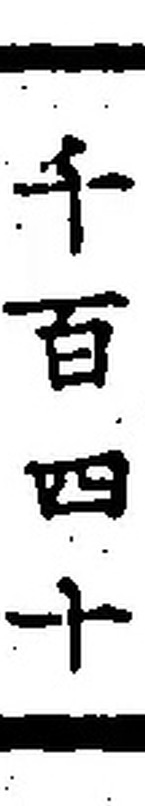千百四十
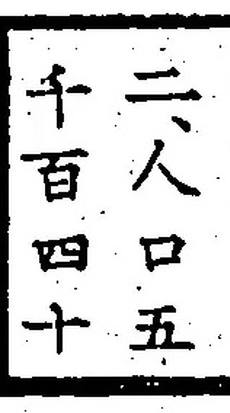千百四十
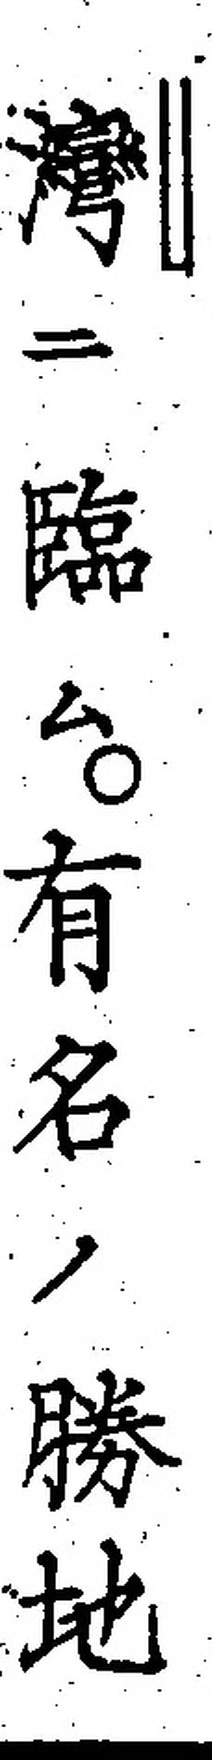湾ニ臨ム。有名ノ勝地
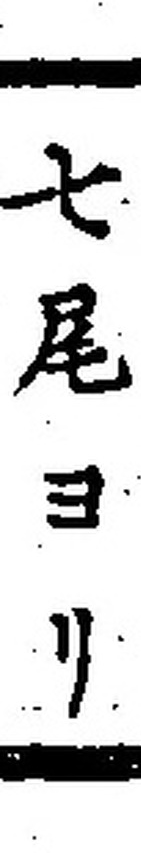七尾ヨリ
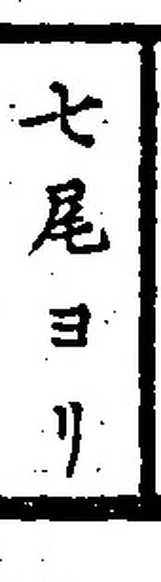七尾ヨリ
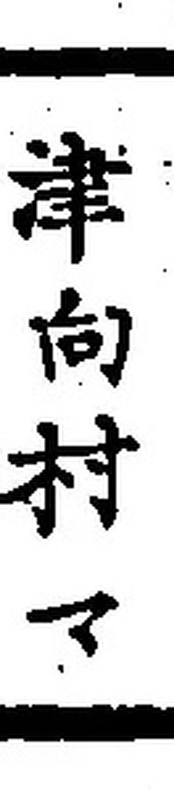津向村マ
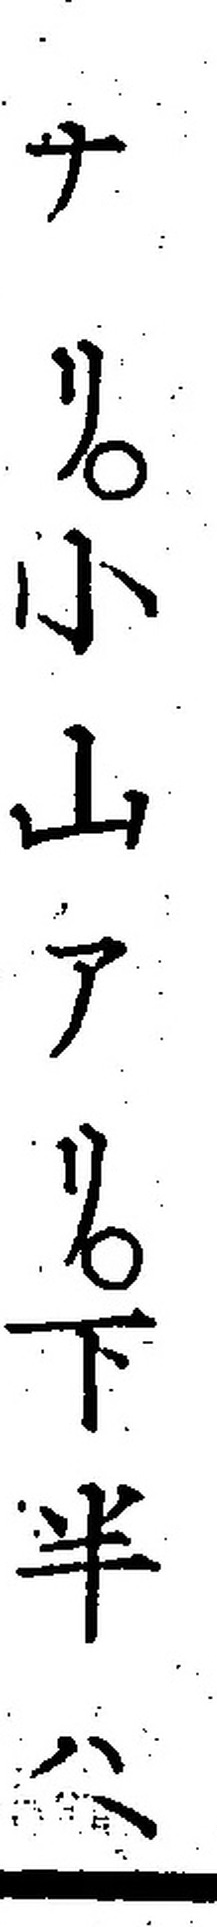ナリ。小山アリ。下半ハ、
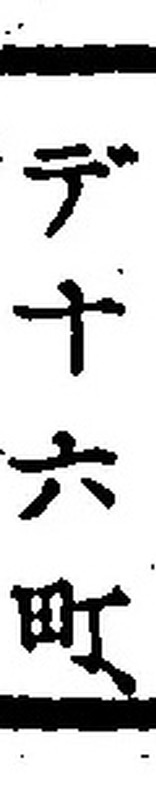デ十六町、
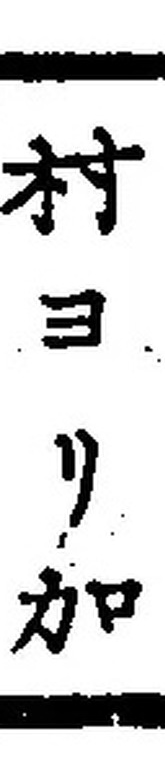村ヨリ加
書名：能登地誌略
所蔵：国立国会図書館 National Diet Library, JAPAN
